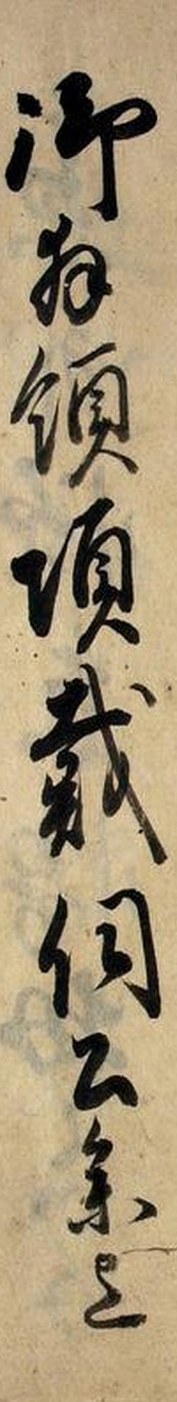御拝領頂戴伺公参上
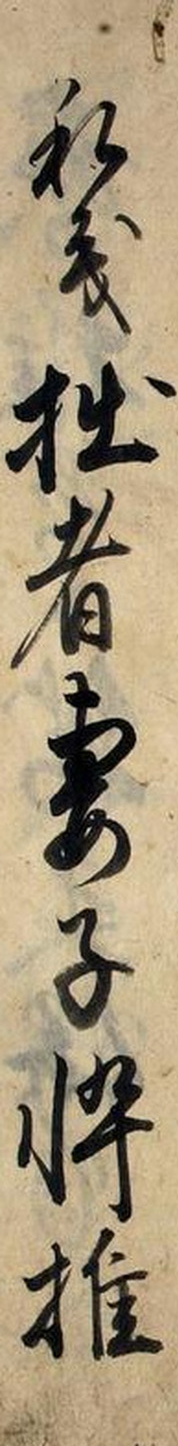私義拙者妻子忰推

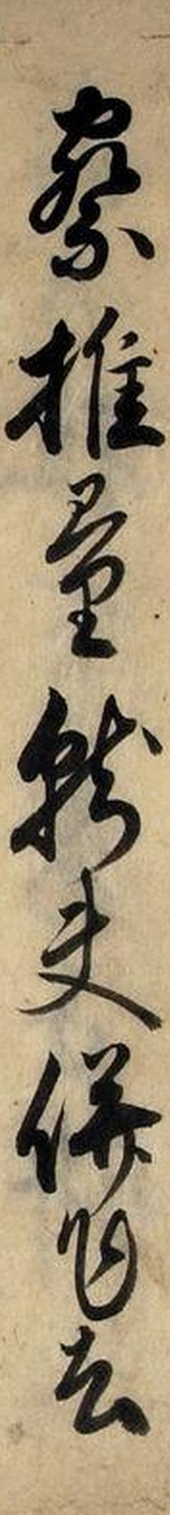察推量就夫併乍去
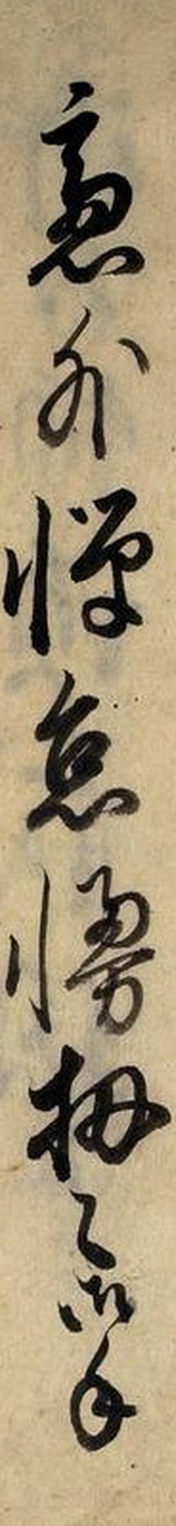慮外憚怠慢扨〻御手
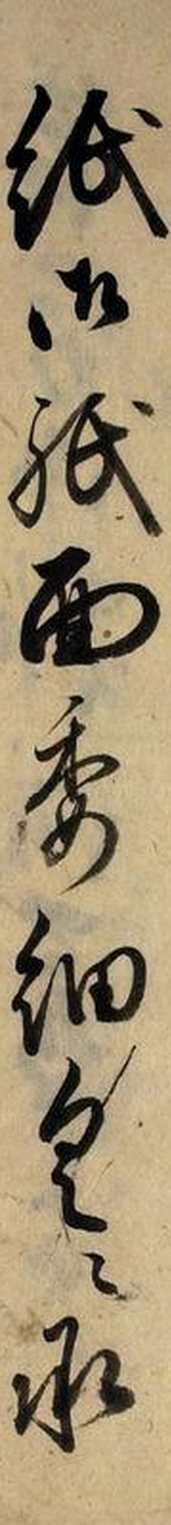紙御紙面委細具ニ承
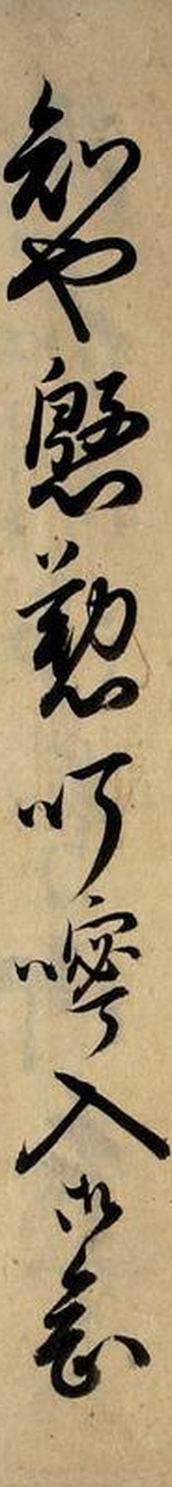知也慇懃叮嚀入御念
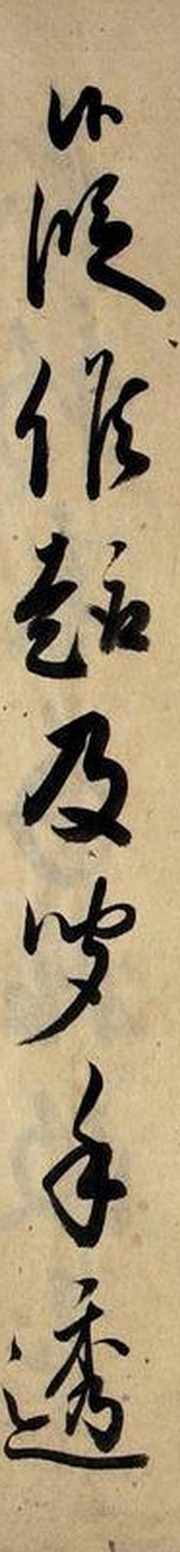候段候趣及聞手透
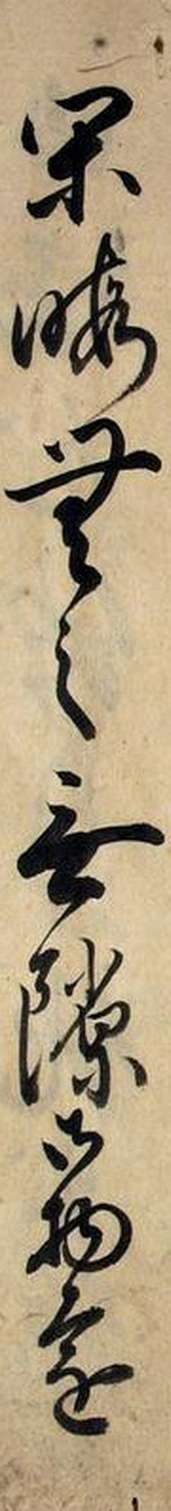閑暇無之無隙御物遠

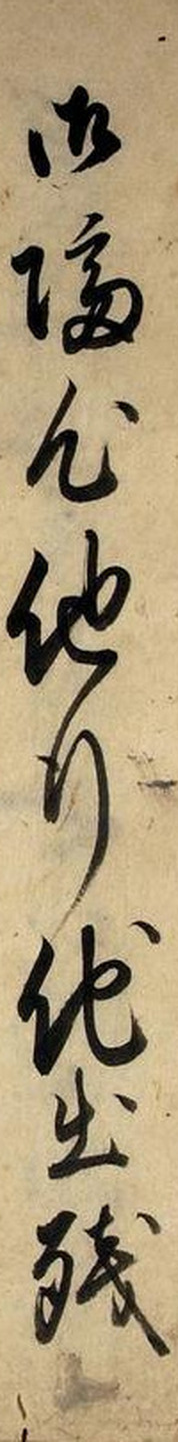御隔心他行他出残
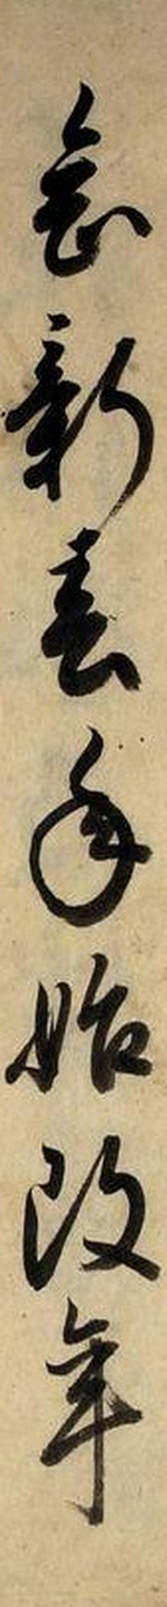念新春年始改年
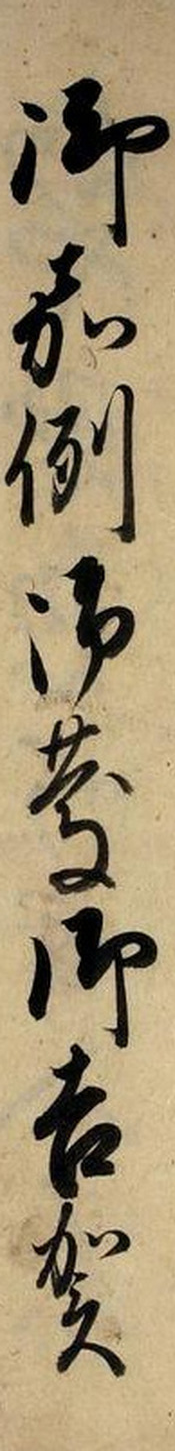御嘉例御慶御吉賀
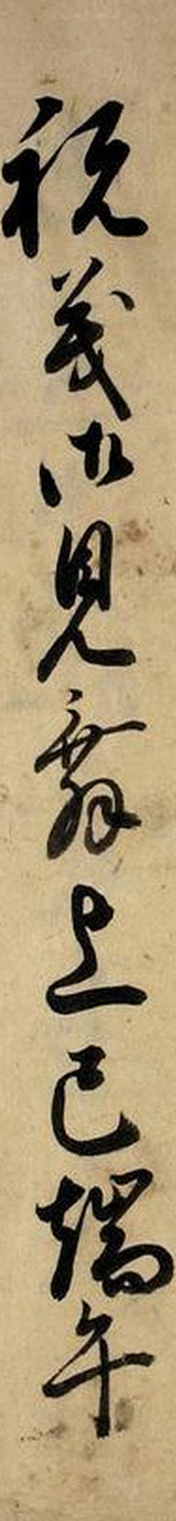祝義御見舞上巳端午
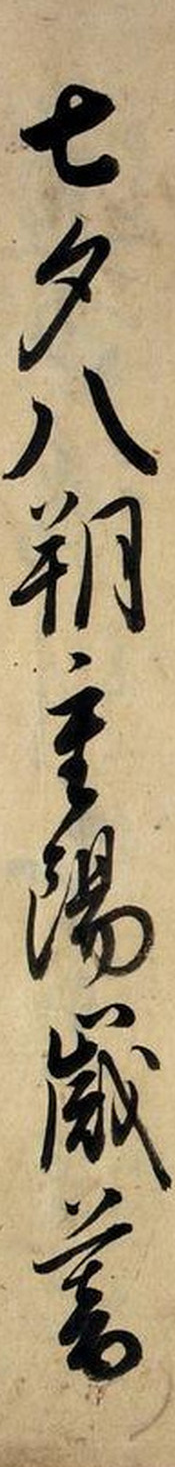七夕八朔重陽歳暮
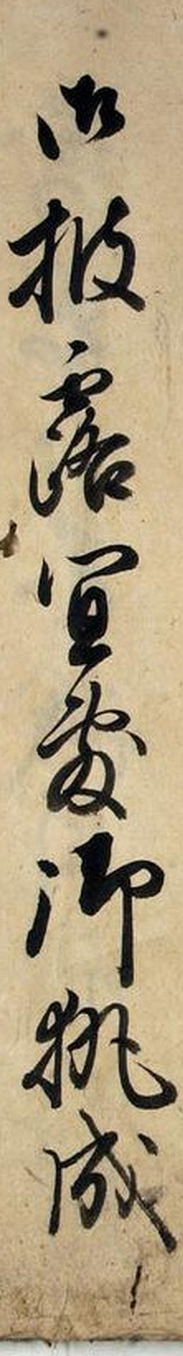御披露宜敷御執成

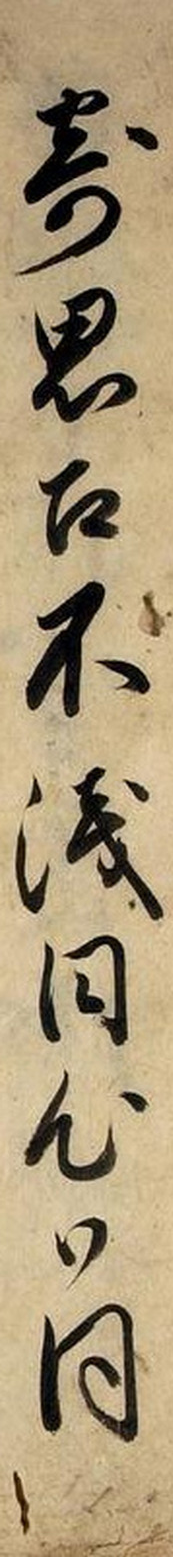寄思召不浅同心御同
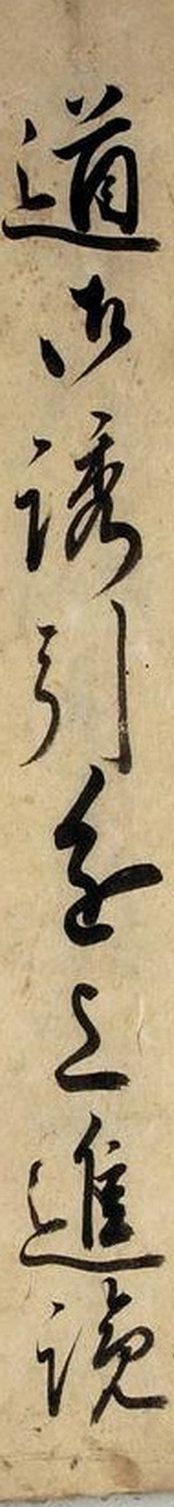道御誘引進上進覧
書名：消息千字文（往来物、手習手本）
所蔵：福井県文書館 Fukui Prefectural Archives
